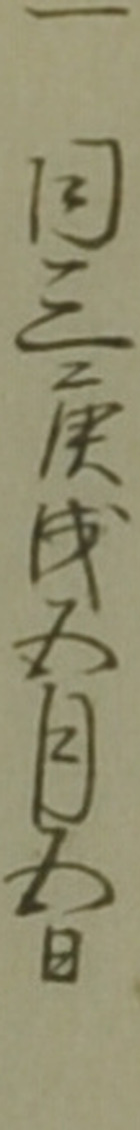一同三庚戌五月五日
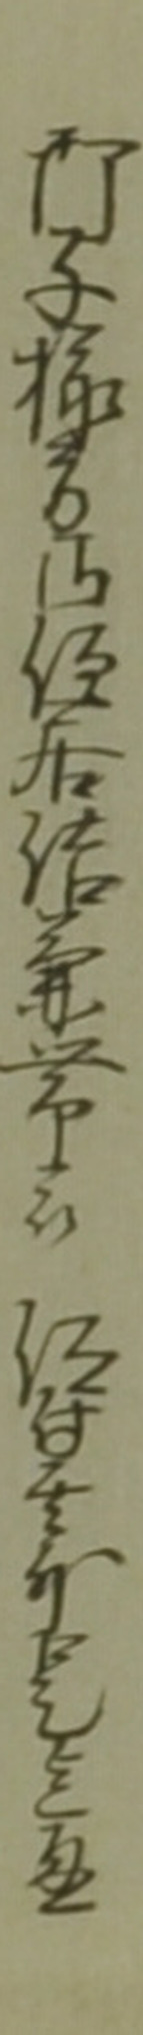御子様方御住居詰兼帯被仰付其外是迄通
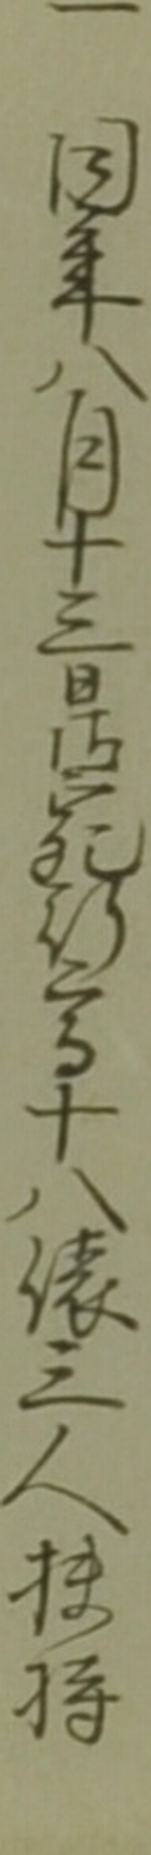一同年八月十三日御宛行高十八俵三人扶持
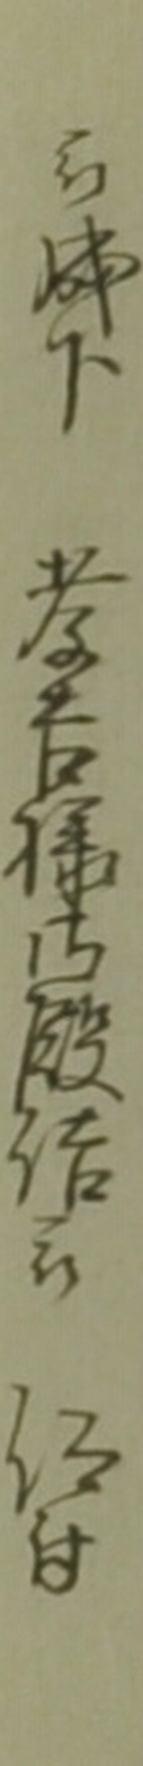被成下孝吉様御殿詰被仰付
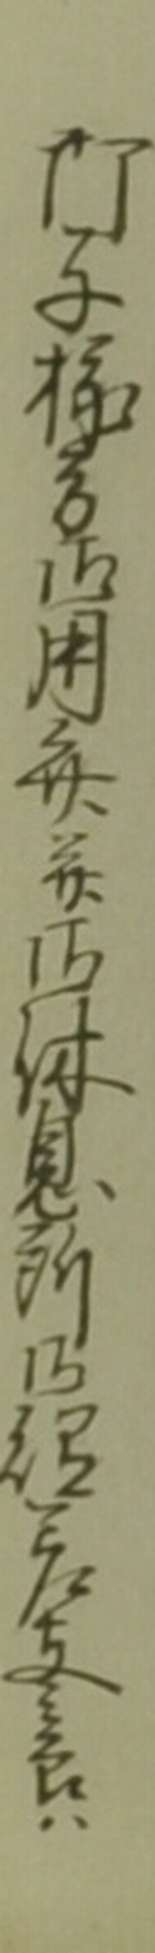御子様方御用弁并御休息所御賄差支之節は
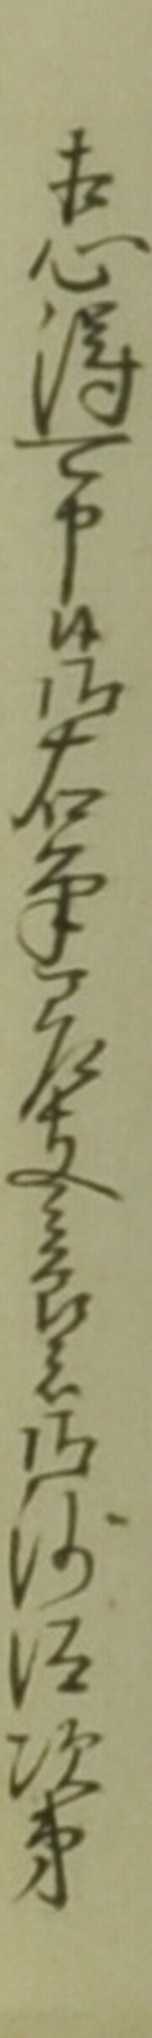相心得可申候御右筆差支之節者御沙汰次第

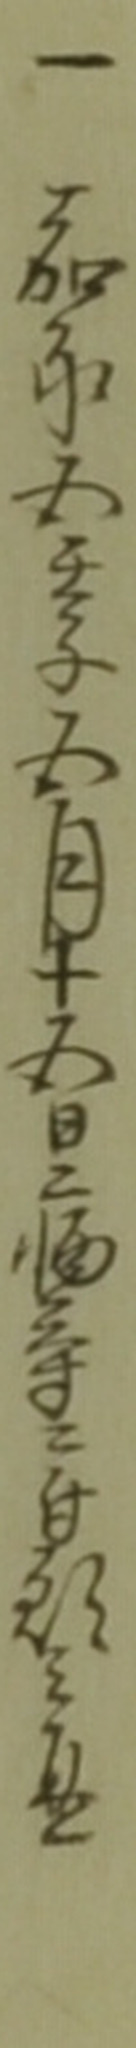一嘉永五壬子五月十五日病気ニ付願之通
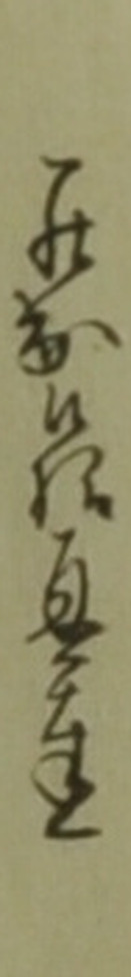罷出候様通達
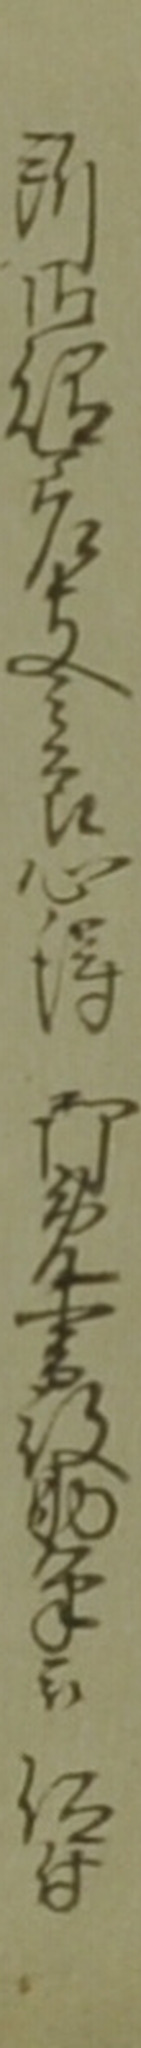所御賄差支之節心得御免書役助筆被仰付
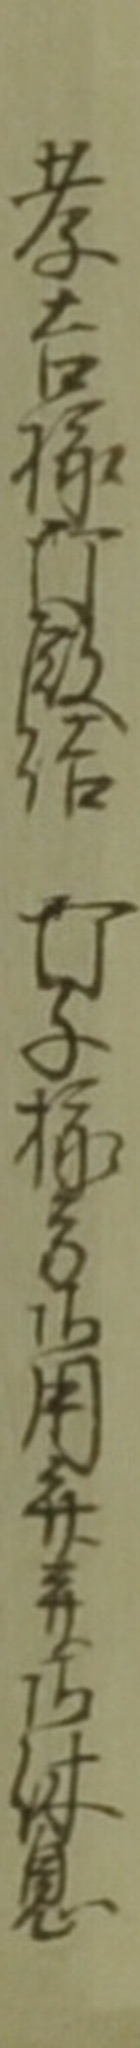孝吉様御殿詰御子様方御用弁并御休息
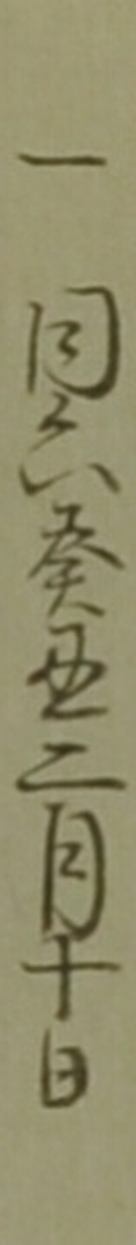一同六癸丑二月十日
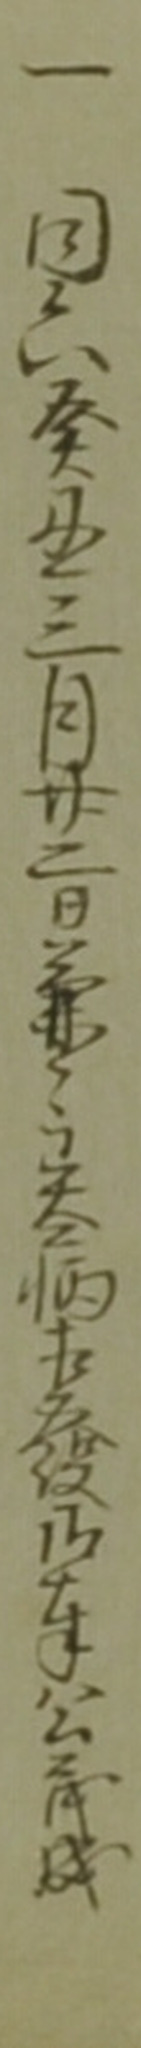一同六癸丑三月廿二日兼々異病相発御奉公茂成
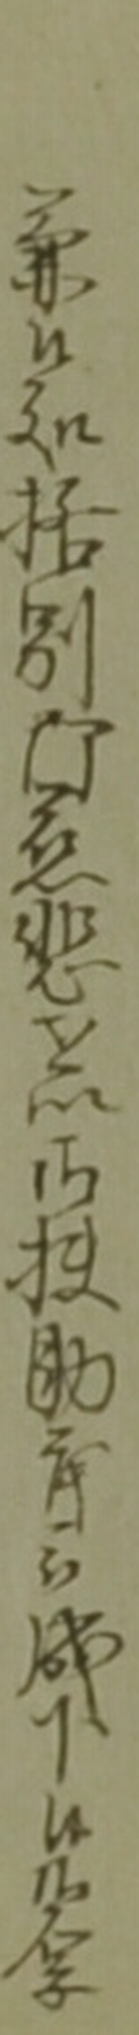兼候処格別御慈悲を以御扶助茂被成下候御厚
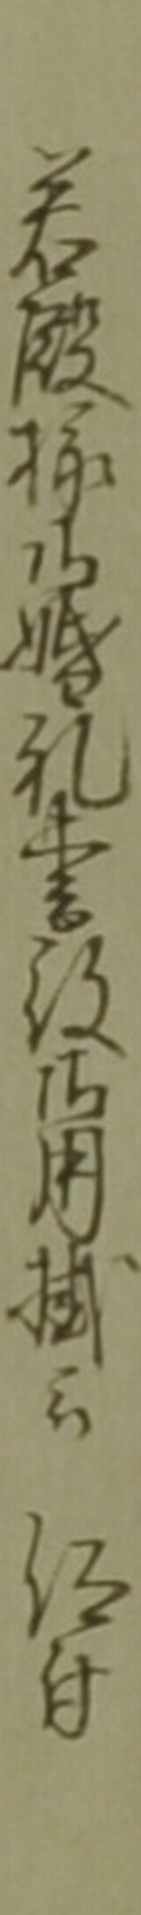若殿様御婚礼書役御用掛被仰付
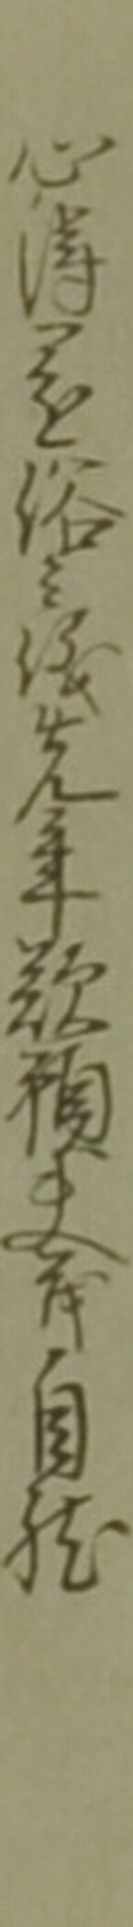心得還俗之儀先年歎願夫茂自然
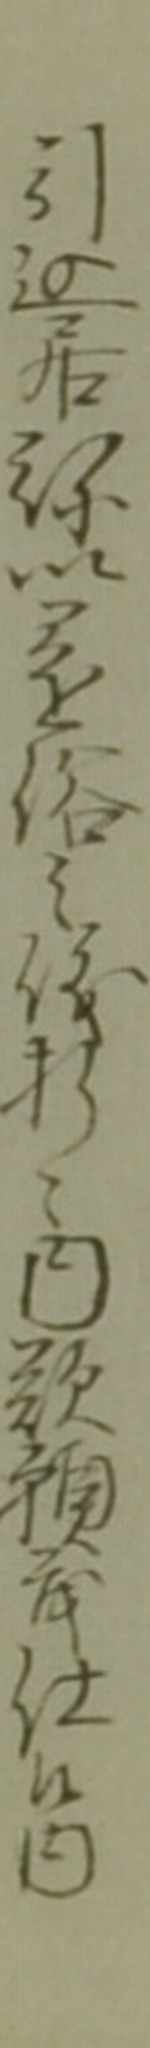引込居弥以還俗之儀折々内歎願茂仕候内
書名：無足諸士勤仕録（一）
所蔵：伊那市立高遠町図書館・合同会社AMANE
